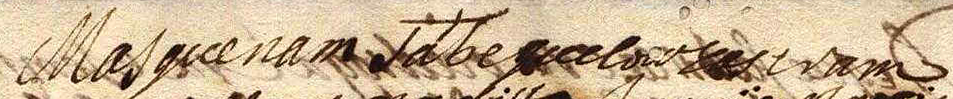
Mas que nam sabe que couzas eram
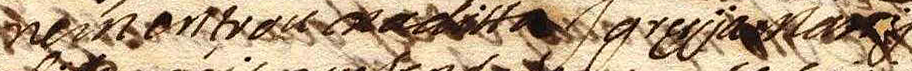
nem entrou na ditta Jgreja mais
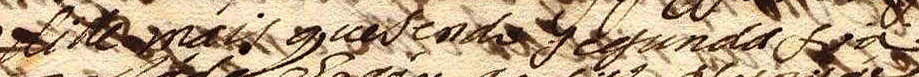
disse mais que sendo segunda fra
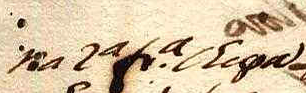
na 2a fr.a chega
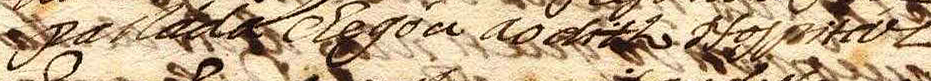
passada chegou ao ditto HospitaL
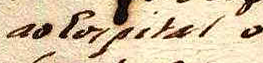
ao hospital o
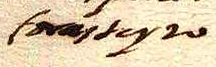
forasteyro
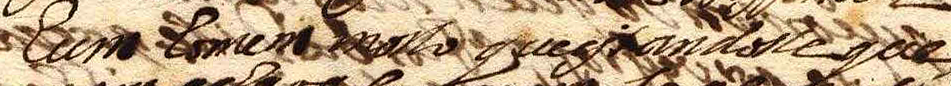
hum homem mosso que estandosse que
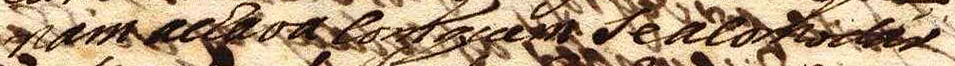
nam achava com quem se acomodar
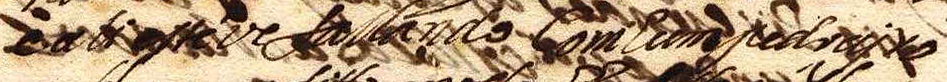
e ahi esteve fallando com hum pedreyro
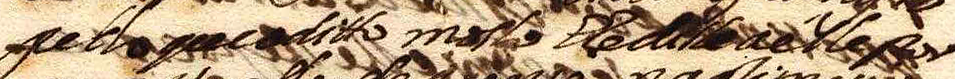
pello que o ditto mosso lhe disse a elle por
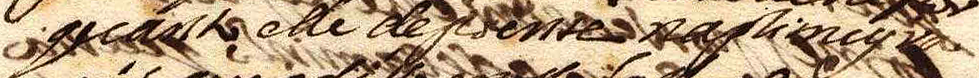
quanto elle depoente na primeyra
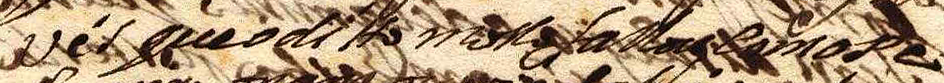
vés que o ditto mosso fallou com o pe
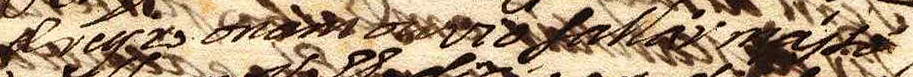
dreyro o nam ouvio fallar mas só
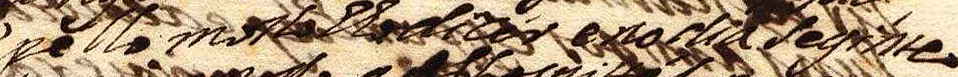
pello mosso lho dizer e no dia seguinte
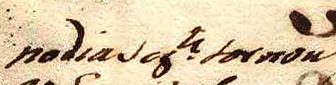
no dia seg.te tornou
